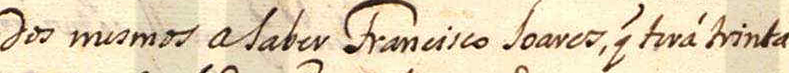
dos mesmos a saber Francisco Soares, q̅ terá trinta
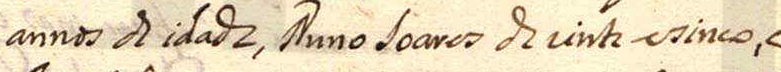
annos de idade, Nuno Soares de vinte e sinco, e
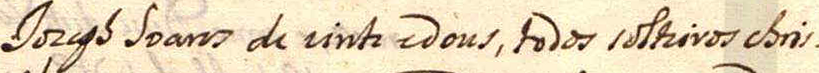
Jozeph Soares de vinte e dous, todos solteiros chris
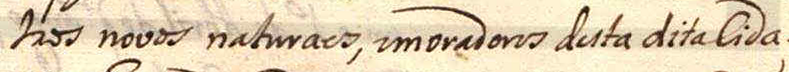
tãos novos naturaes, e moradores desta dita Cida
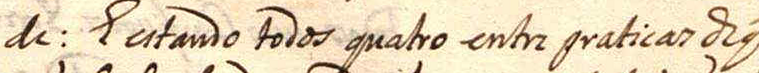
de: E estando todos quatro entre praticas de q̅
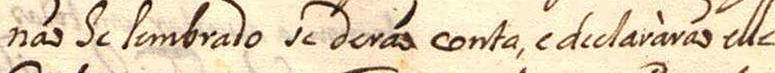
não he lembrado se derão conta, e declararão elle
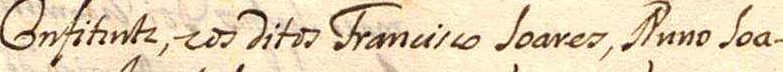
Confitente, e os ditos Francisco Soares, Nuno Soa
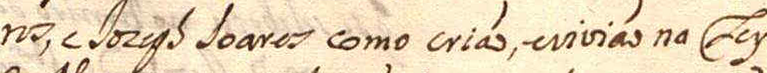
res, e Jozeph Soares como crião, e vivião na Ley
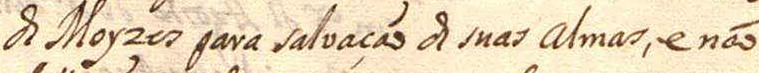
de Moyzes para salvação de suas Almas, e não
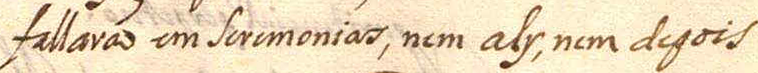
fallarão em Seremonias, nem aly, nem depois
